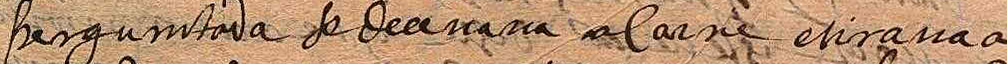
pergumtada se deceuaua a Carne e tiraua a
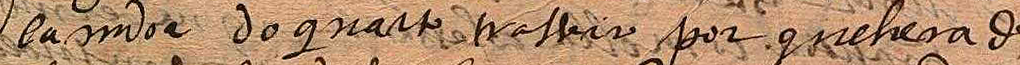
landoa do quarto trasseiro por que hera de
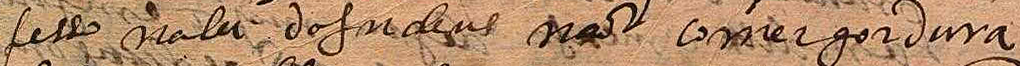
fesso na lei do Judeus naõ comer gordura
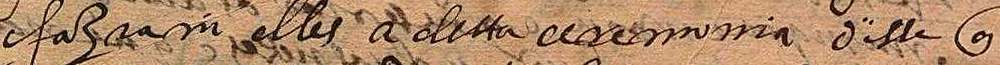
e faziam elles a ditta ceremonia disse q̄
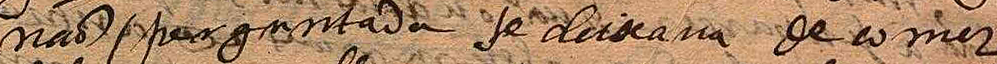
naõ / perguntada se deixaua de comer
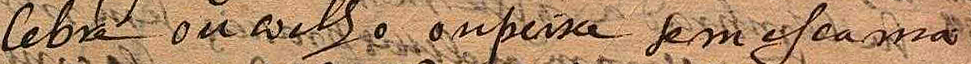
lebre ou coelho ou peixe sem escama
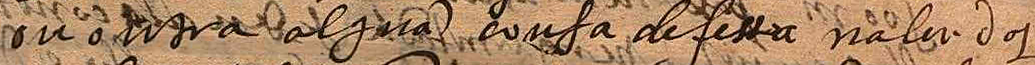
ou outra alguā cousa defessa na lei dos
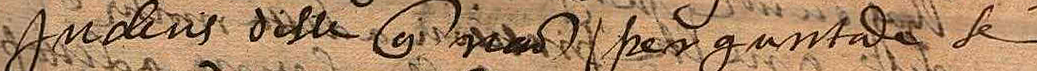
Judeus disse q̄ naõ / perguntada se
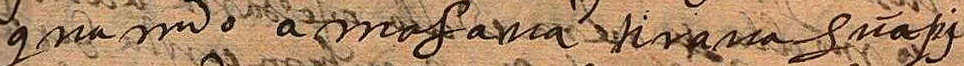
quamdo amasaua tiraua hūa pj
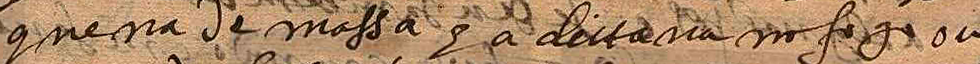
quena de massa E a deitaua no fogo ou
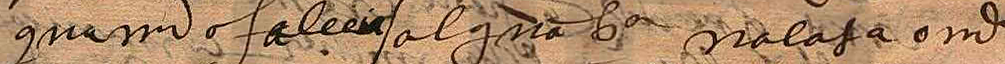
quamdo falecia / alguā pa na casa onde
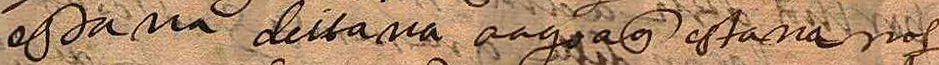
estaua deitaua a agoa q̄ estaua nos
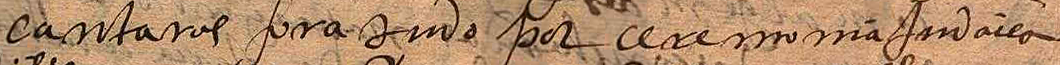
cantaros fora tudo por ceremonia Judaica
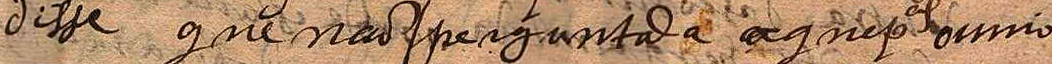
disse que naõ / perguntada a que pas ouuio
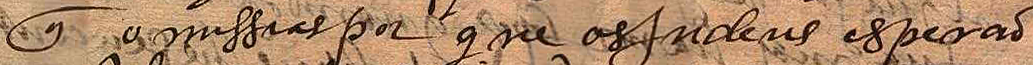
q̄ o missias por que os Judeus esperaõ
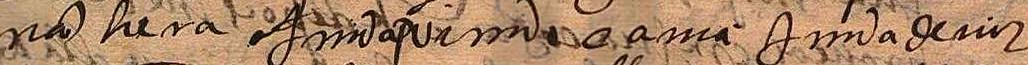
não hera aJnda vimdo e auia Jmda de uir
